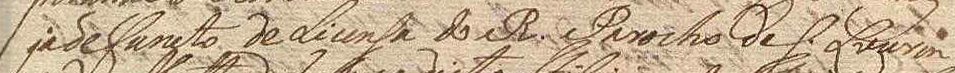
ja defuncto de Licensa do R. Parocho de s. Louren
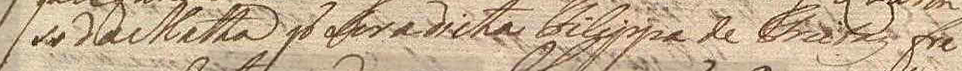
so da Matta pr ser a dicta Filippa de Freitas fre
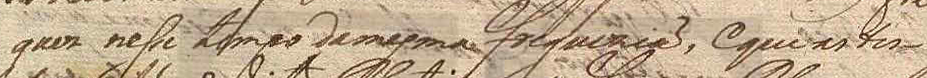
guez nesse tempo da mesma freguezia, E que as tes
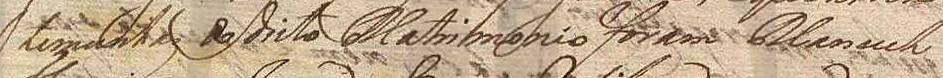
temunhaz do dicto Matrimonio foram Manuel
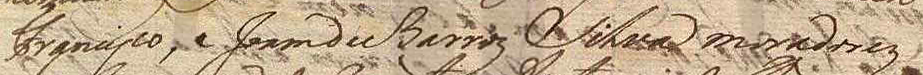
Francisco, e Joam de Barroz Silva moradorez
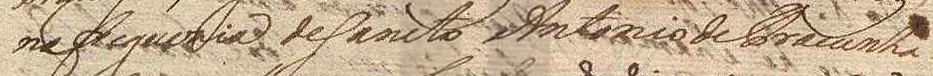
na freguezia de Sancto Antonio de Pracunha
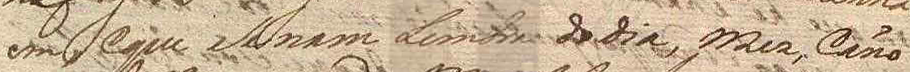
em e que se nam Lembra do dia, mez, e an̄o
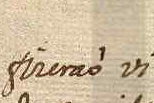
fizeraõ vi
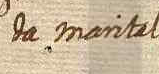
da marital
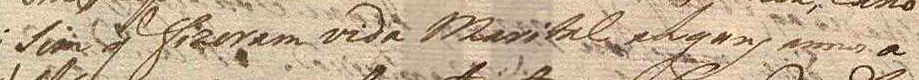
sim q̄ fizeram vida Marital alguns annos a
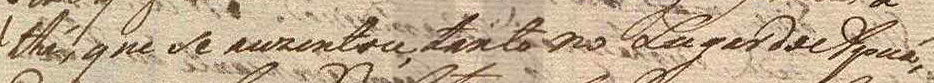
thé, que se auzentou, tanto no Lugar do Apuá,
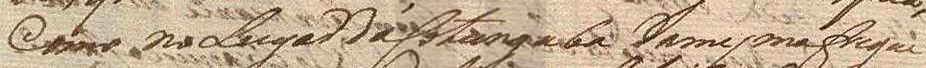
Como no Lugar da Cotungaba da mesma fregue
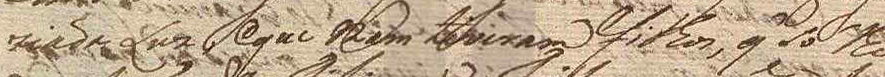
zia da Luz, E que Nam tiveram filhos, q̄ só lhe
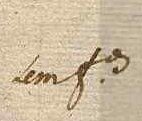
sem f.os
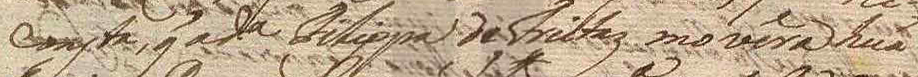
Consta, q̄ a d.a Filippa de Freitaz movêra huā
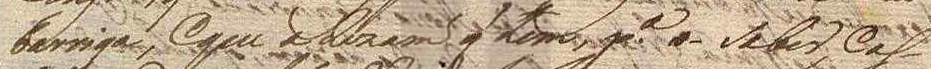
barriga, E que a Rezam q̄ tem, p.a o saber, E as
